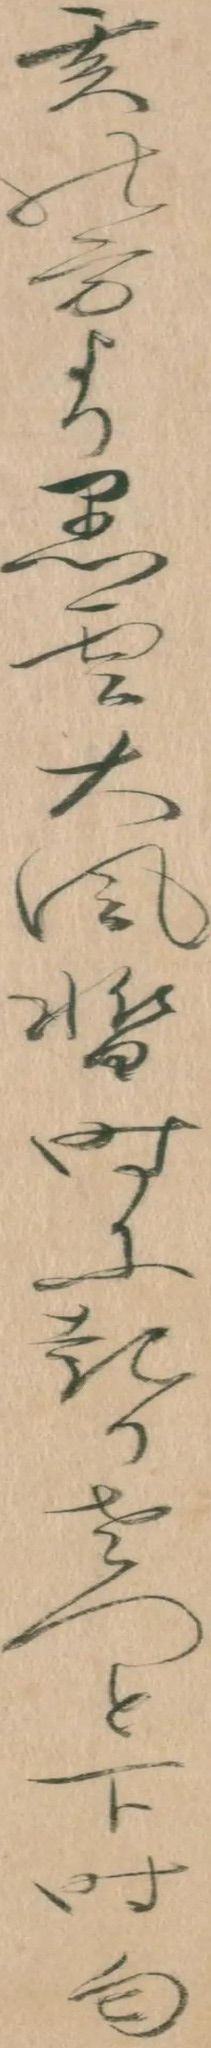亥の方より黒雲大風暫時に起りさつと下時匂
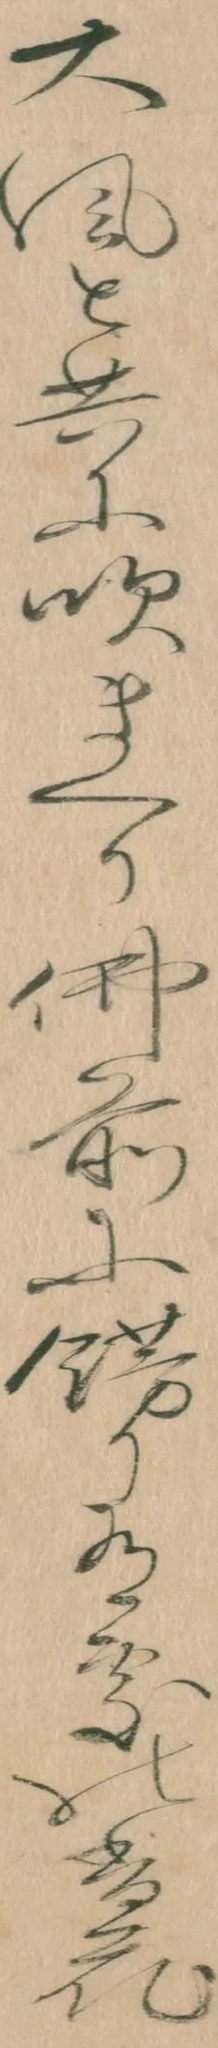大風と共に吹まくり仏前に飾り有處の香花
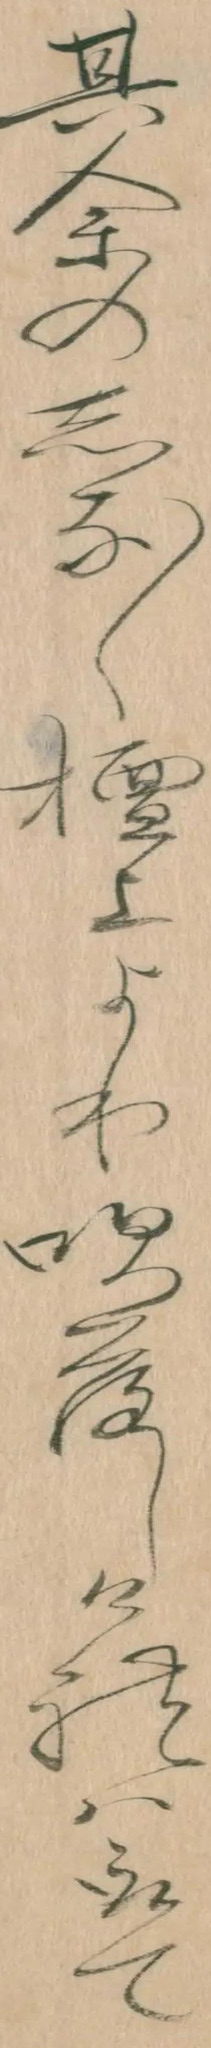其余のしな〳〵壇上より吹落しけれは取て
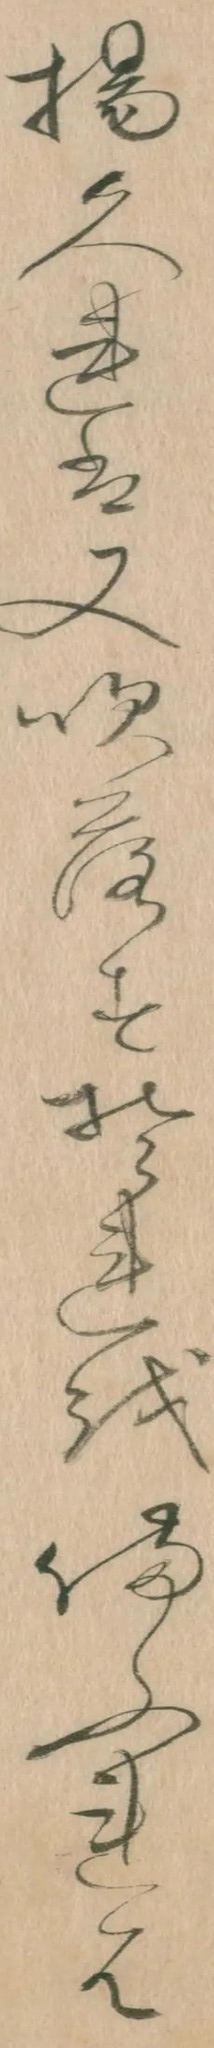揚くれは又吹落すそれを揚ふれは
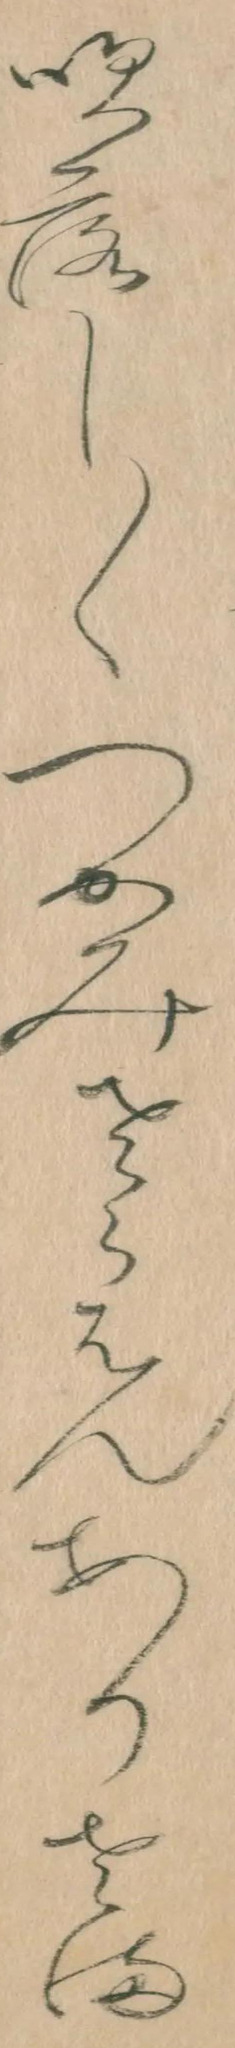吹落し〳〵つかみさらはんありさま
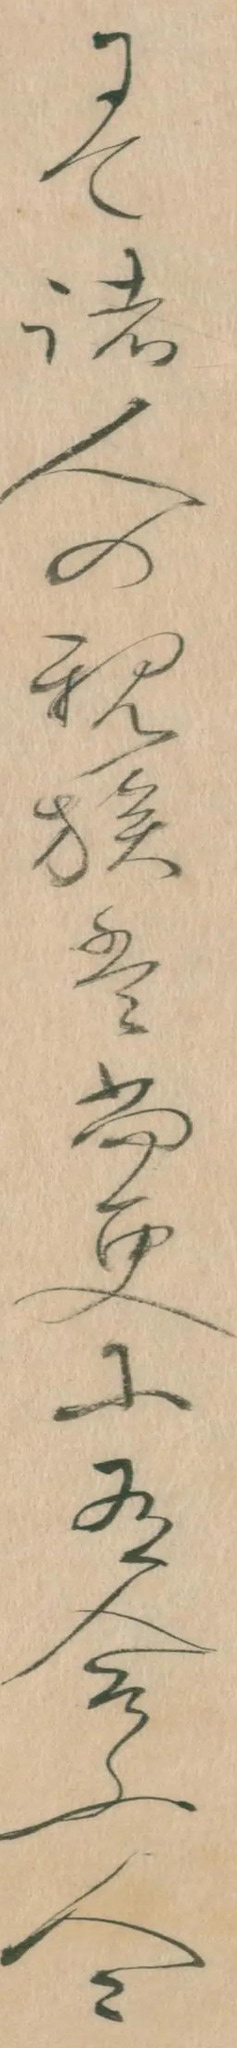にて諸人の親族は尚更に有合ふ人々
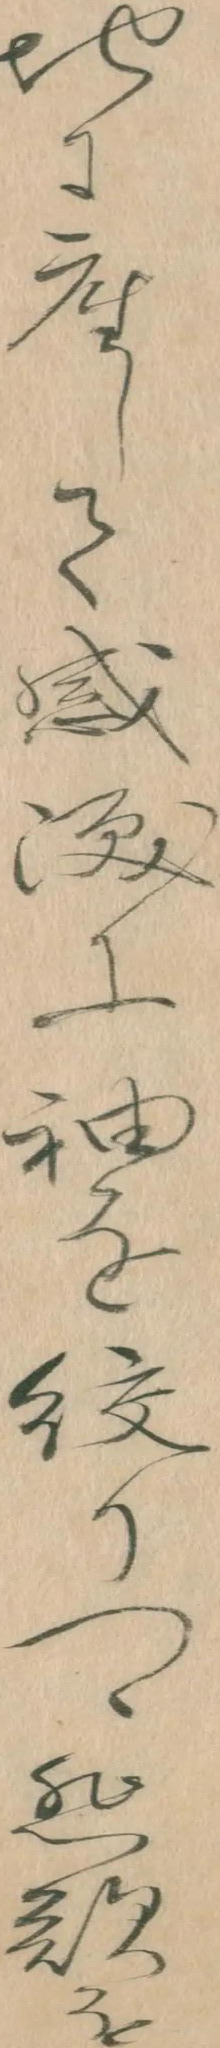地に座して感涙に袖を絞りつゝ愁歎を
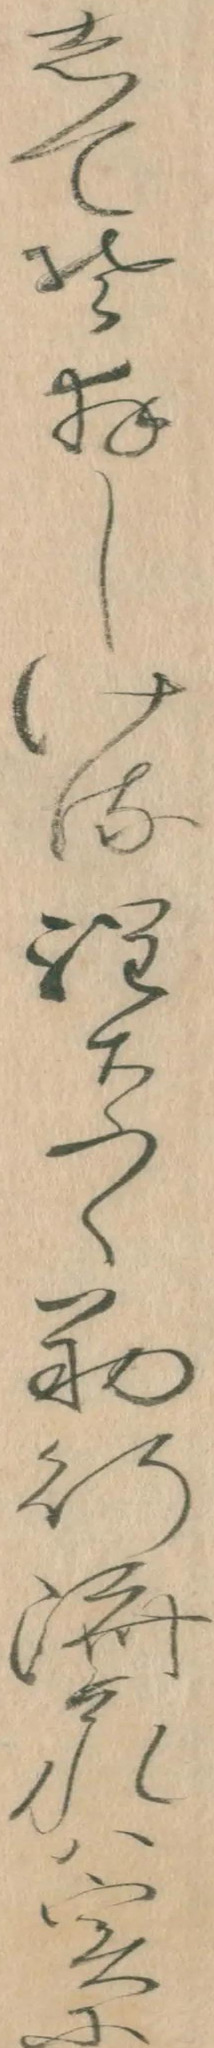してそ拝しける程なく勤行済けれは実に
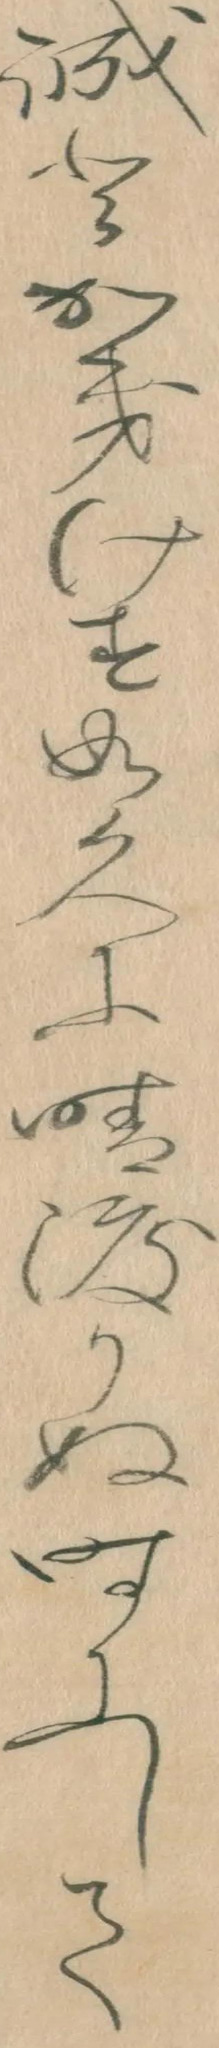誠とかきけす如くに晴渡りぬ時にして
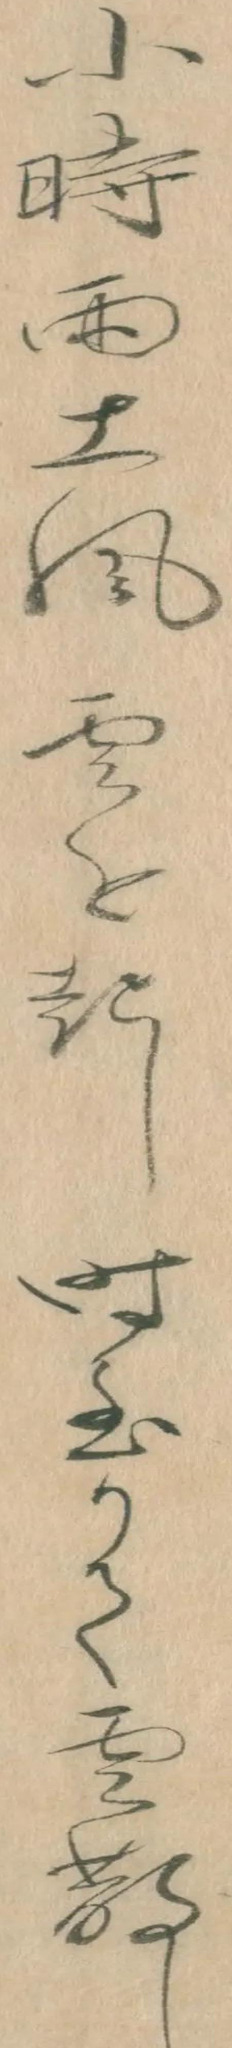小時雨土風雲を起し時至りて雲散し

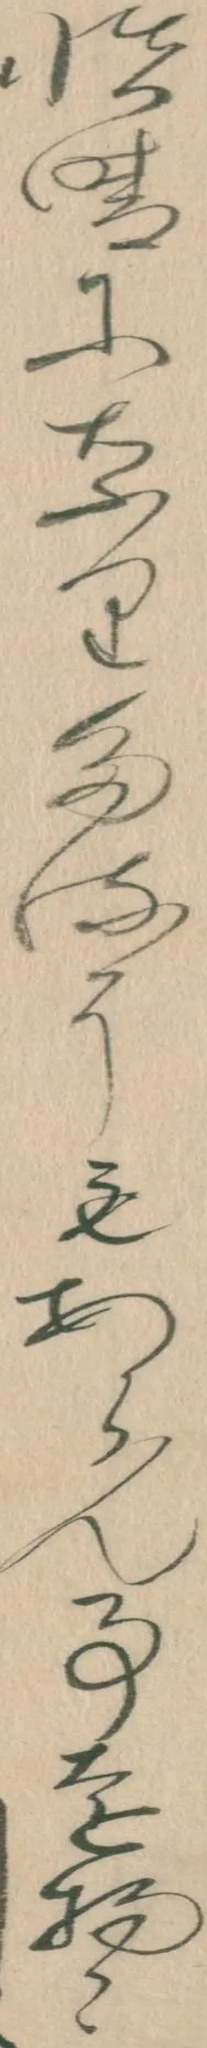快晴になりたるにもあらん事を揚々しく
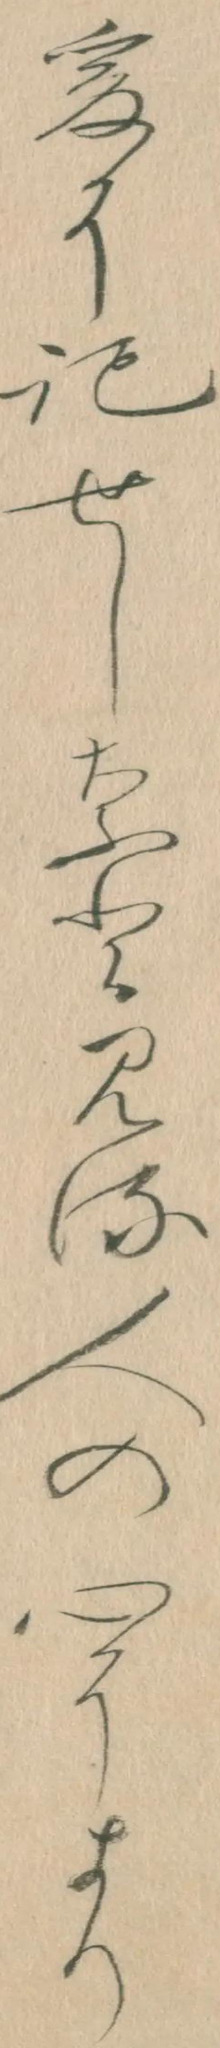爰に記せしなと見る人の心により
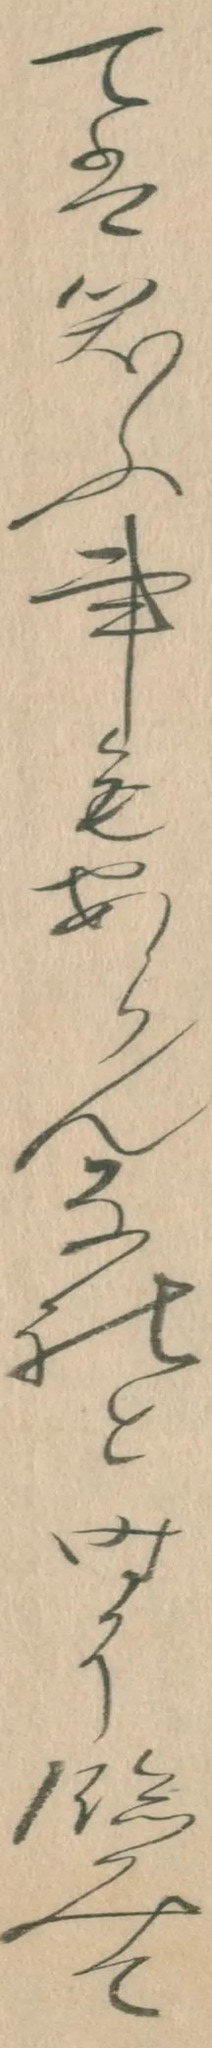ては笑ふ事もあらんなれと時に臨みて
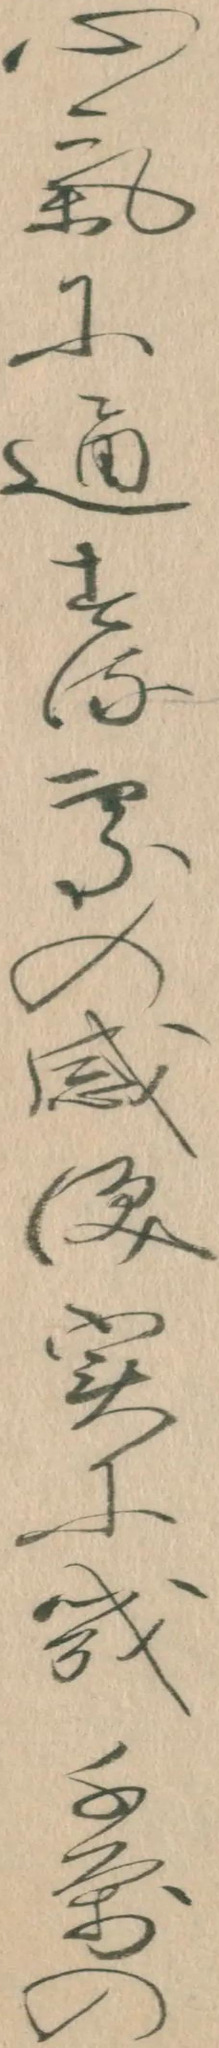心気に通する處の感涙実に幾千萬の
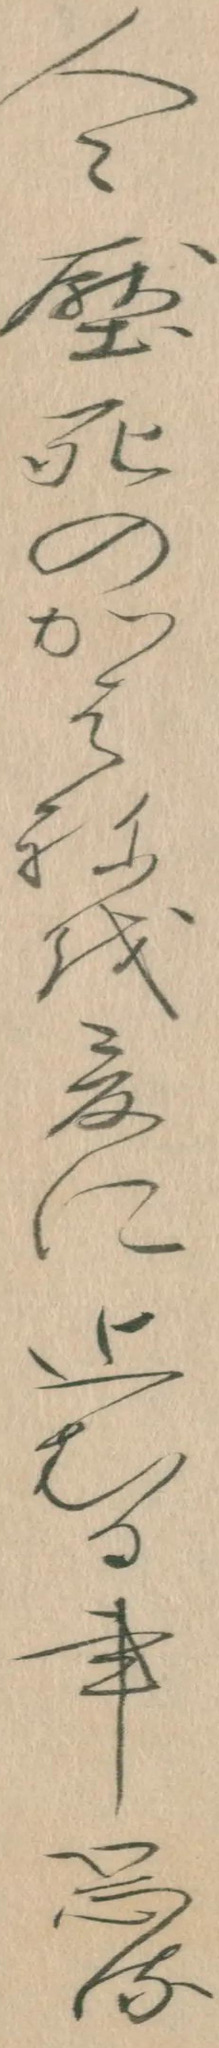人々圧死のかはねを爰に止むる事恐る
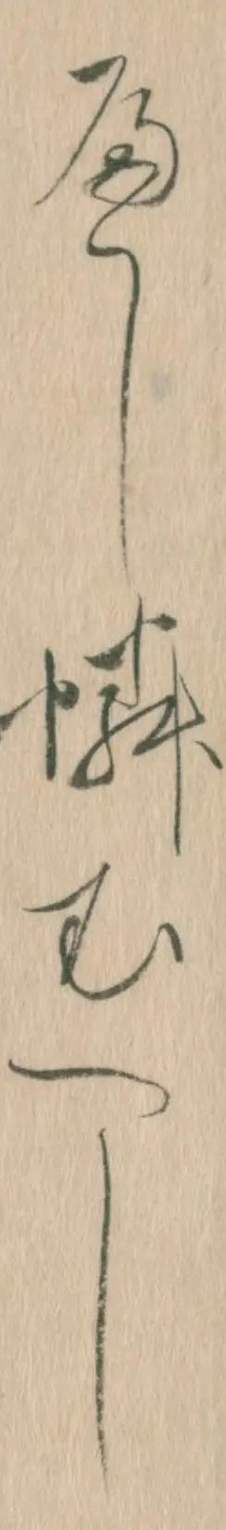へし憐むへし
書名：俗語之種. [5]
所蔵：国立国会図書館 National Diet Library, JAPAN
